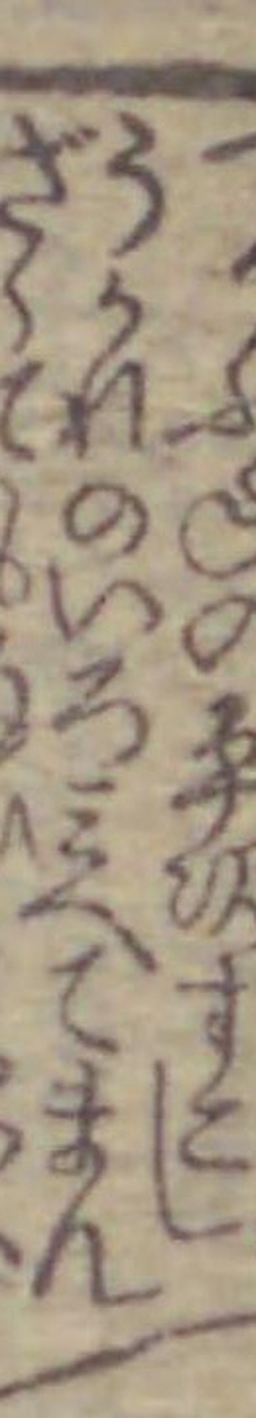うかれのいろみへてまん
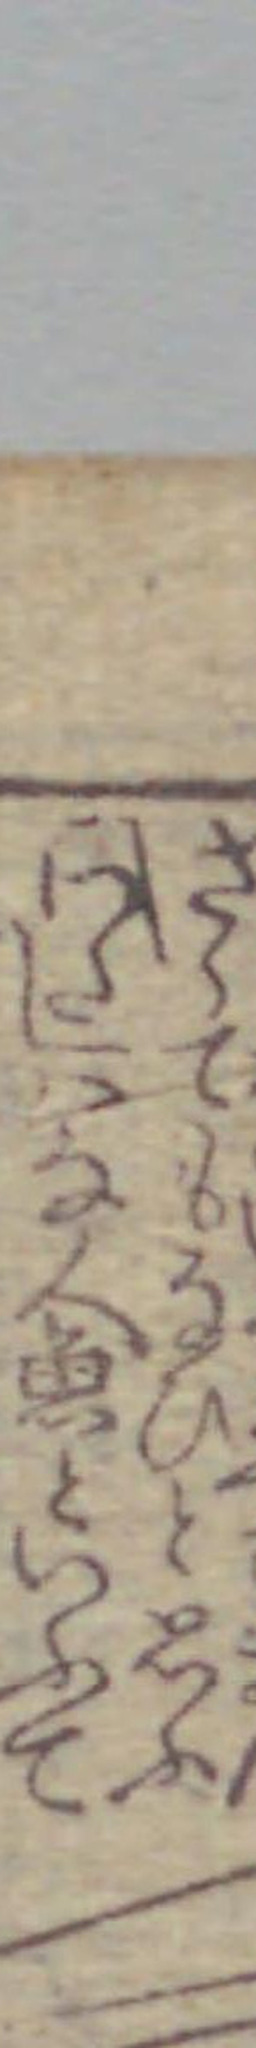〽わたしはな人魚といふて
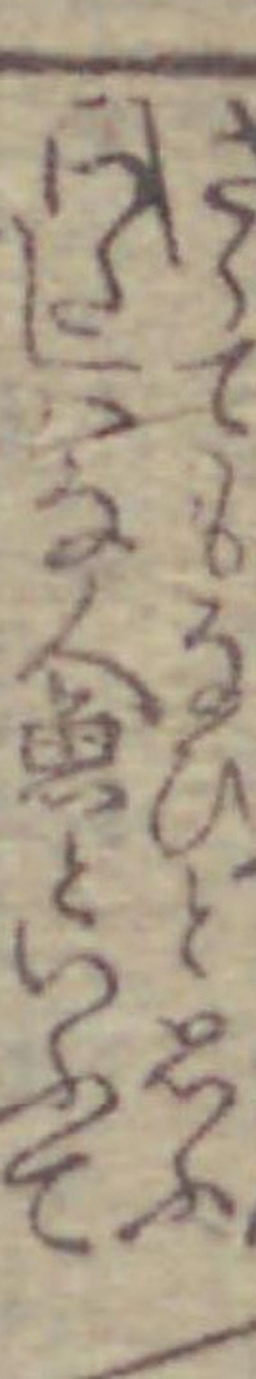〽わたしはな人魚といふて
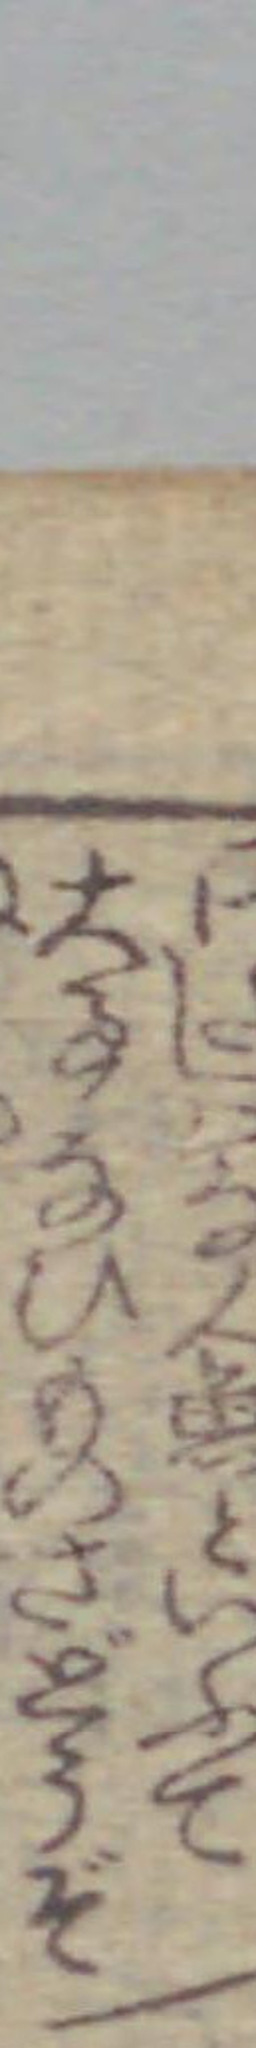大事なひものさどうぞ
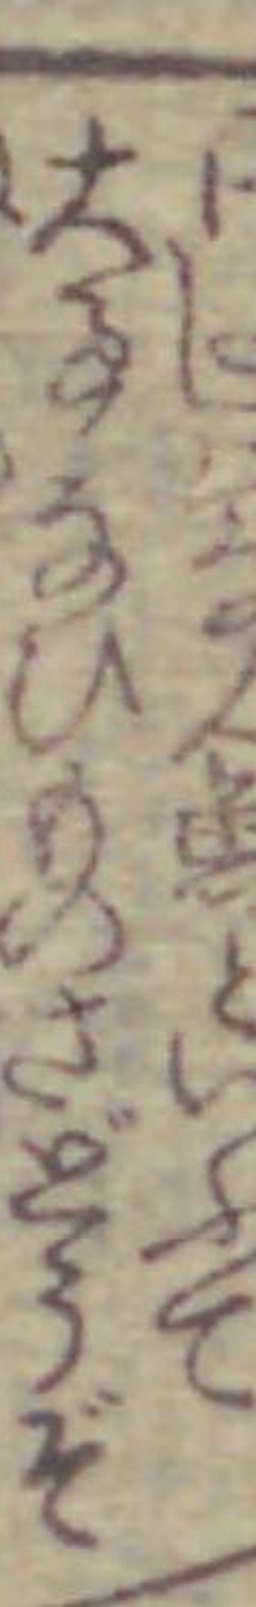大事なひものさどうぞ
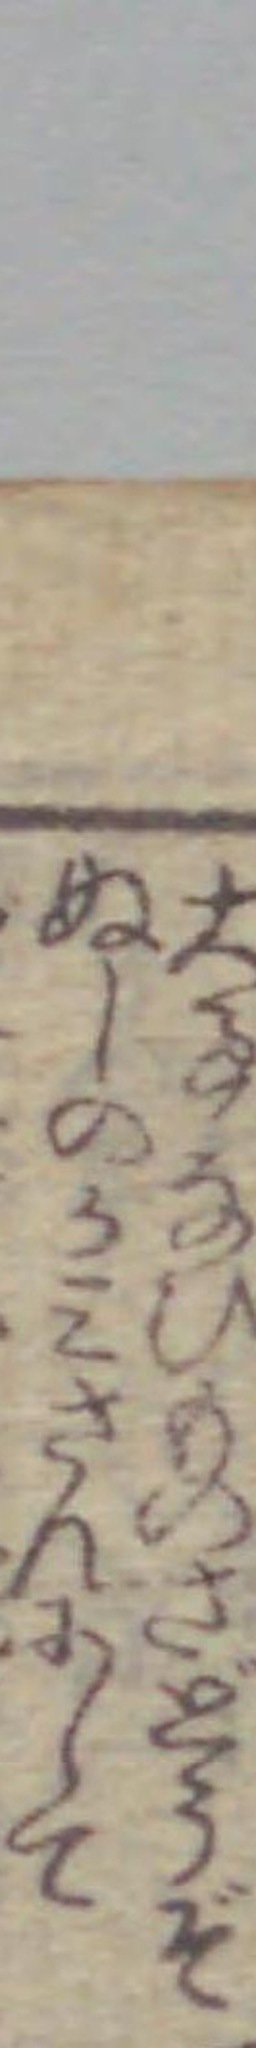ぬしのかみさんにして
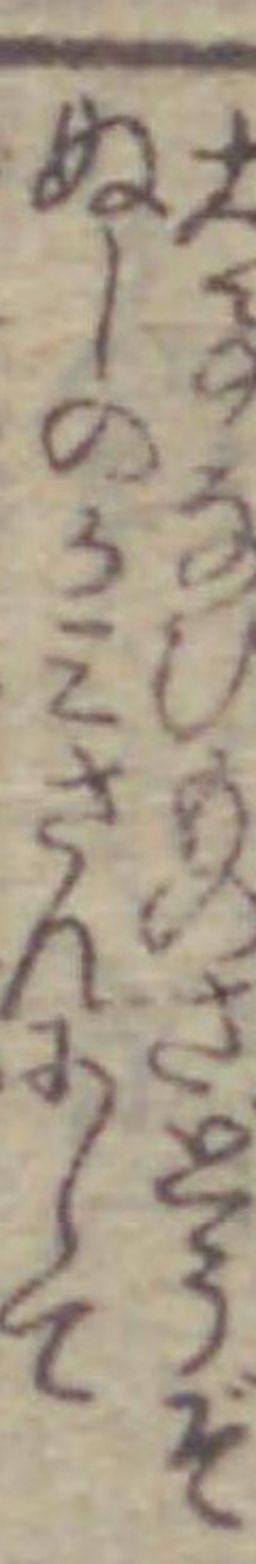ぬしのかみさんにして
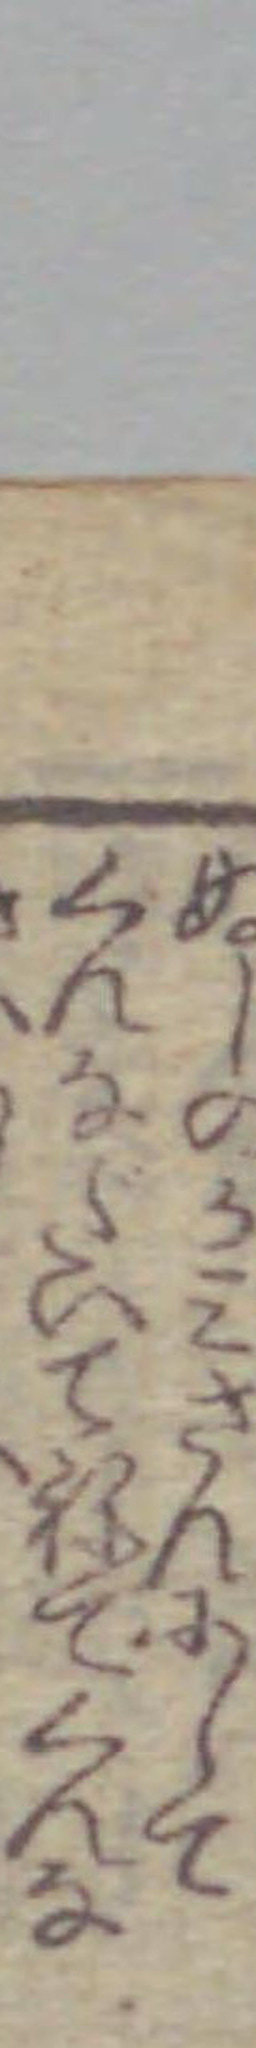くんなだいてねてくんな
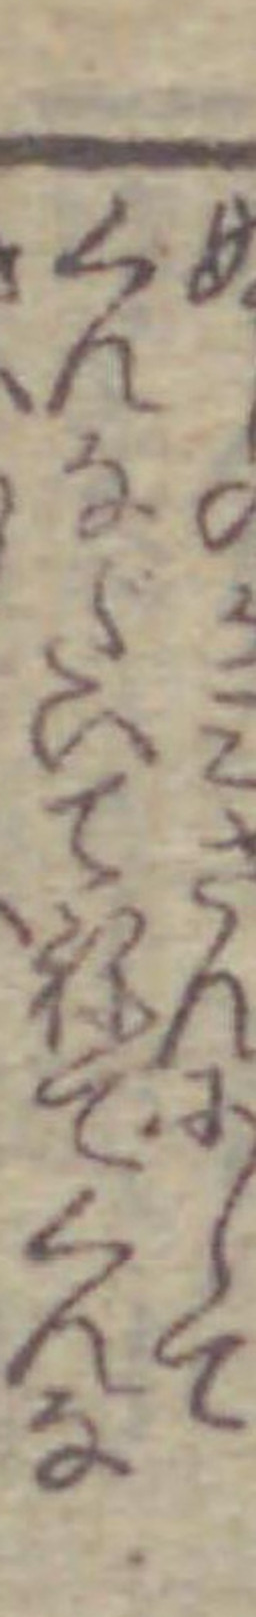くんなだいてねてくんな
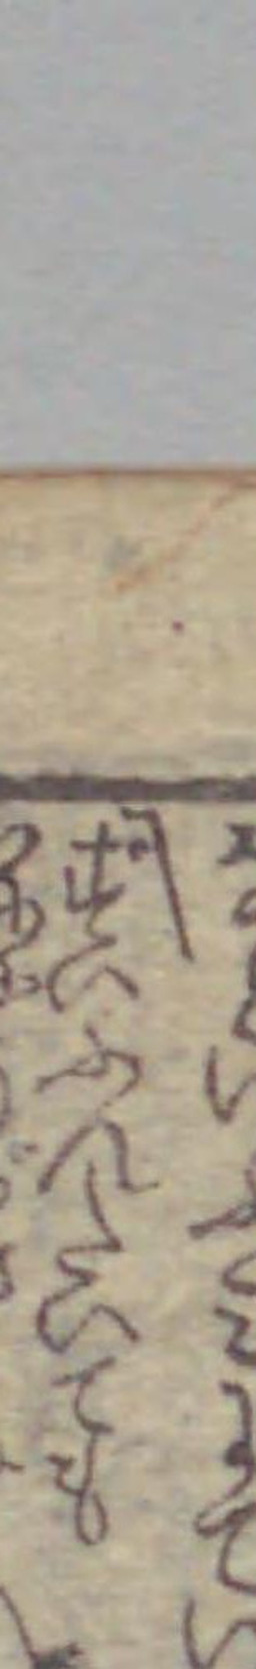〽ずいふんたいても
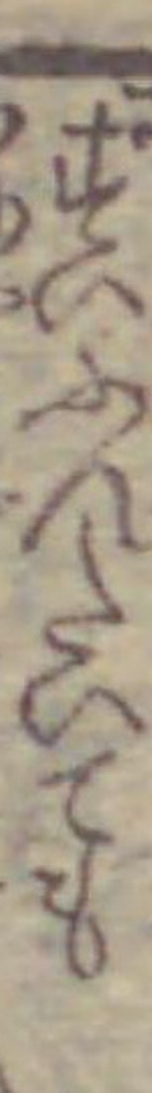〽ずいふんたいても
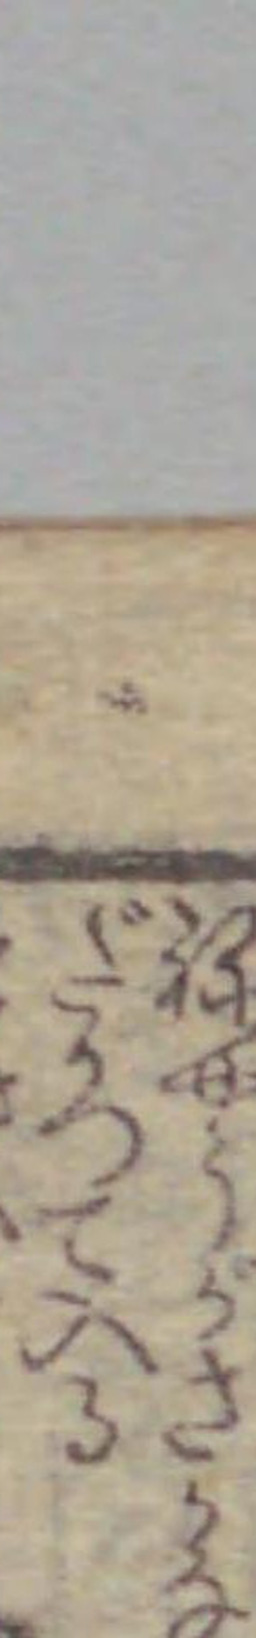だかつて入る
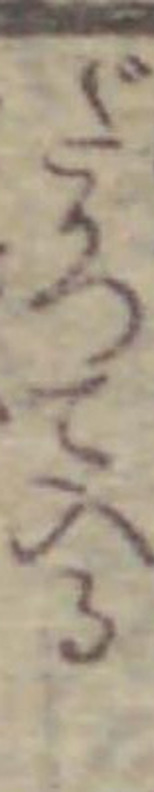だかつて入る
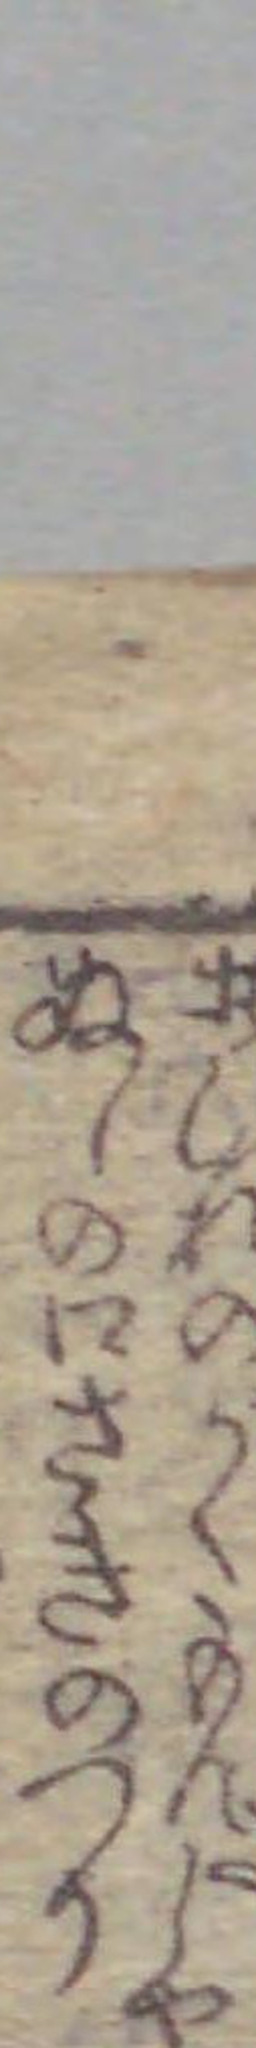ぬしの口さきのつり
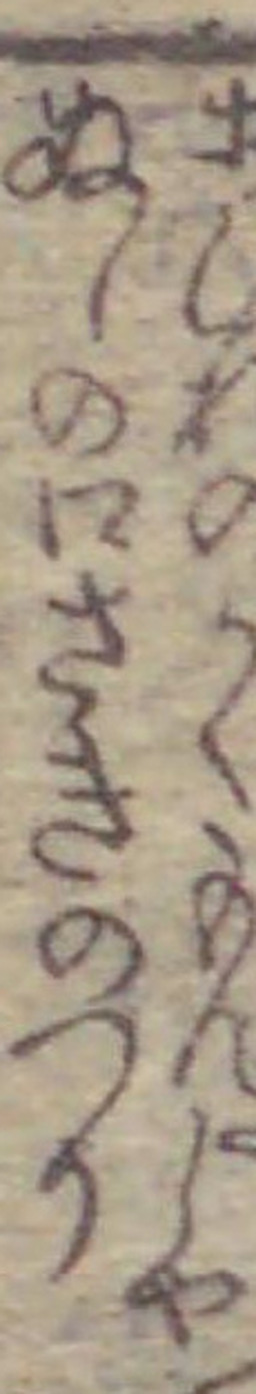ぬしの口さきのつり
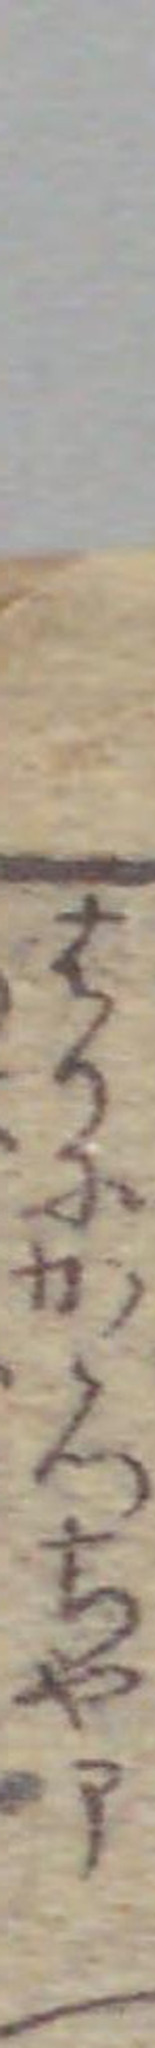はりにかゝつちやァ
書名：箱入娘面屋人魚 3巻
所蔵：国立国会図書館 National Diet Library, JAPAN
